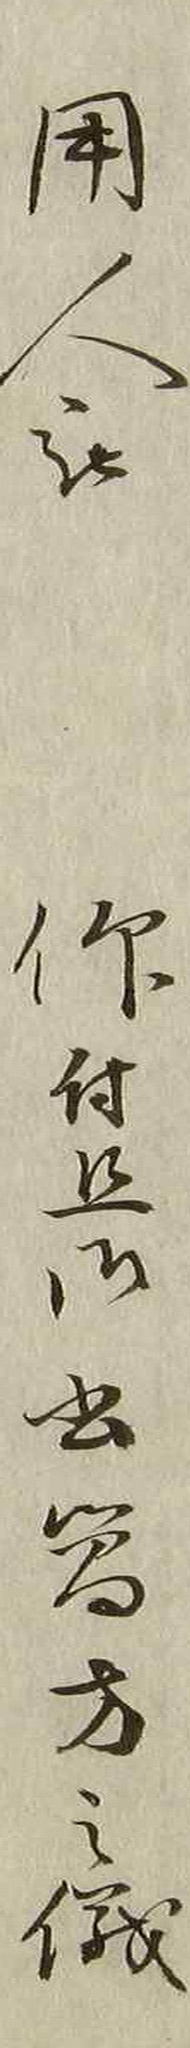用人被仰付且御書簡方之儀
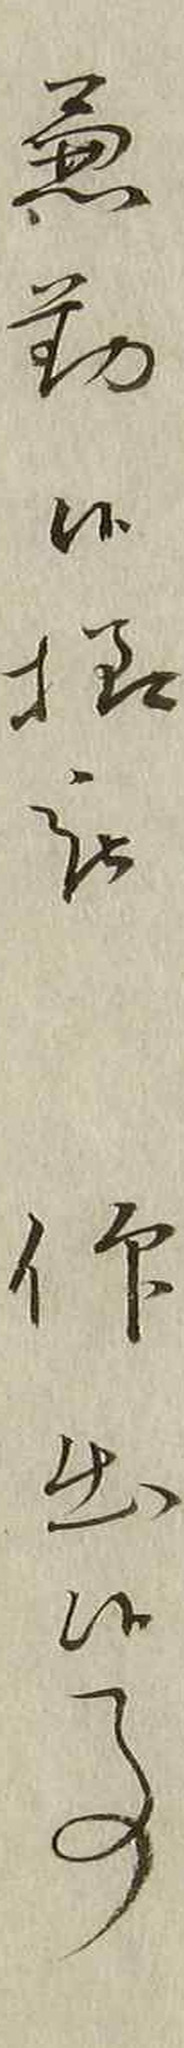兼勤候様被仰出候事
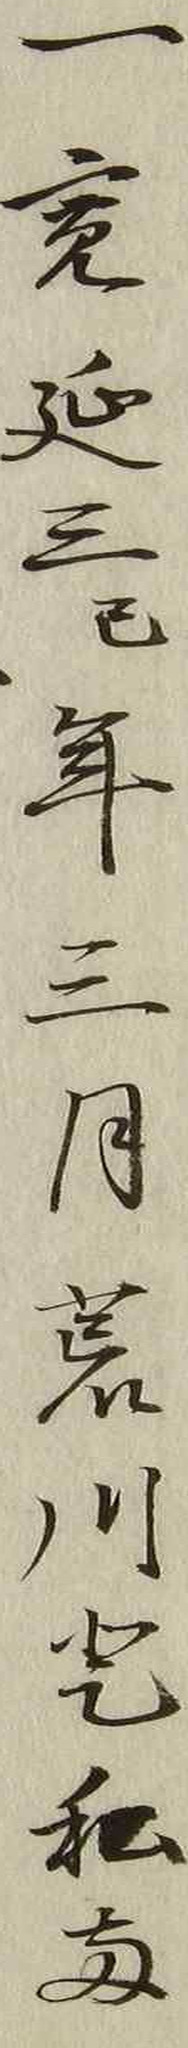一寛延三巳年三月荒川登私両
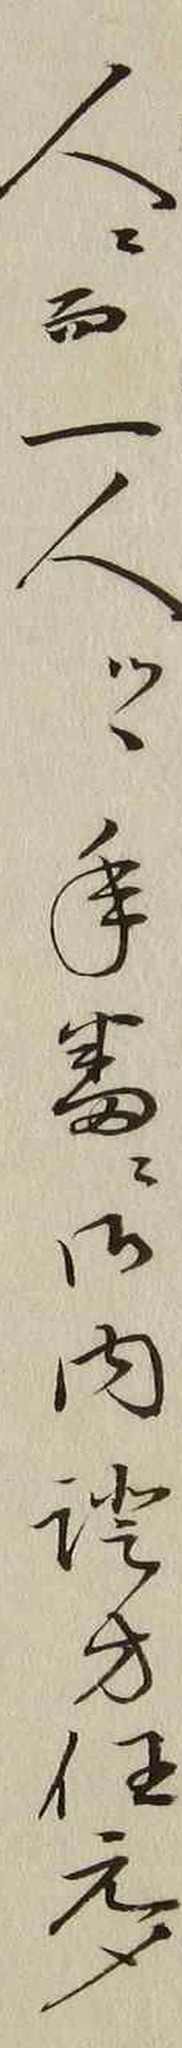人ニ而一人ツヽ年番ニ御内證方任元〆
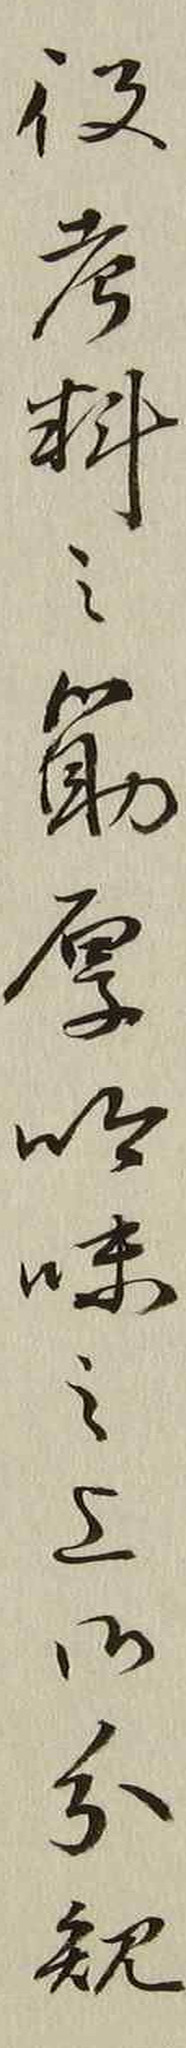役考料之筋厚吟味之上御分規
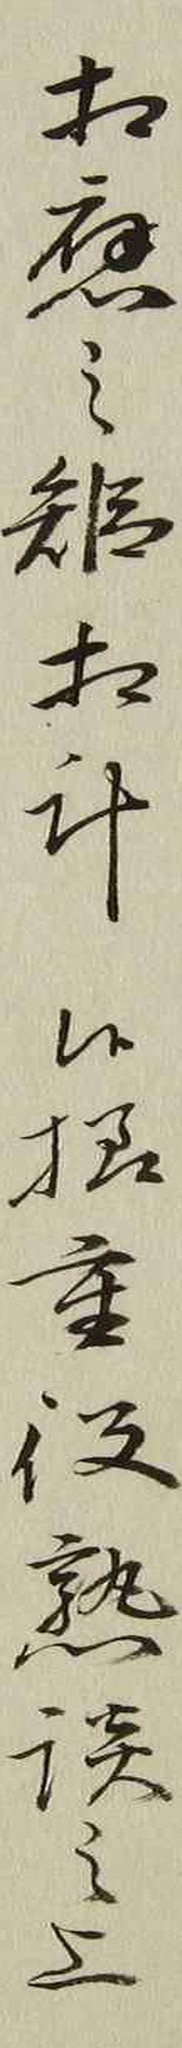相応之矩相計候様重役熟談之上
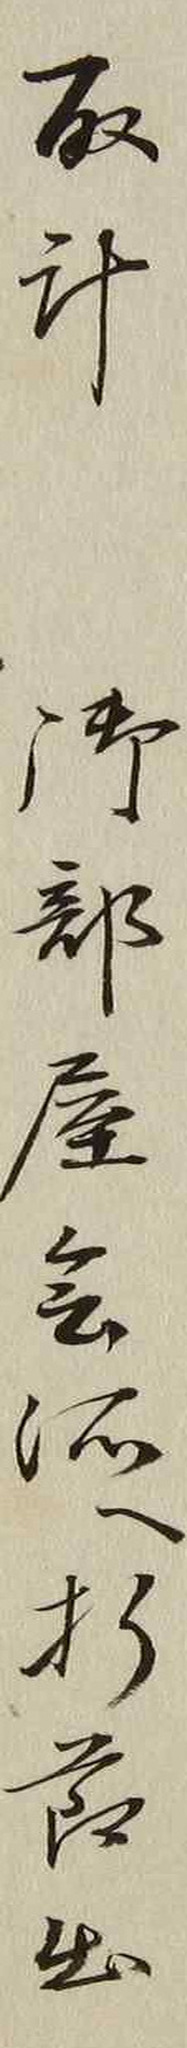取計御部屋会所へ折節出
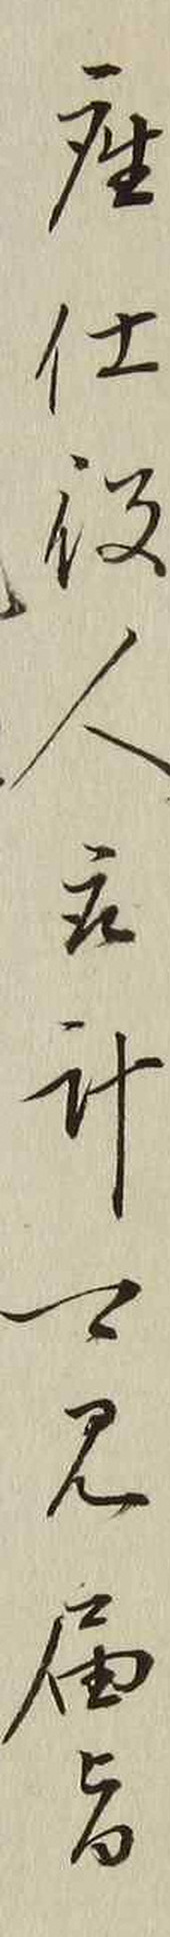座仕役人取計可見届旨
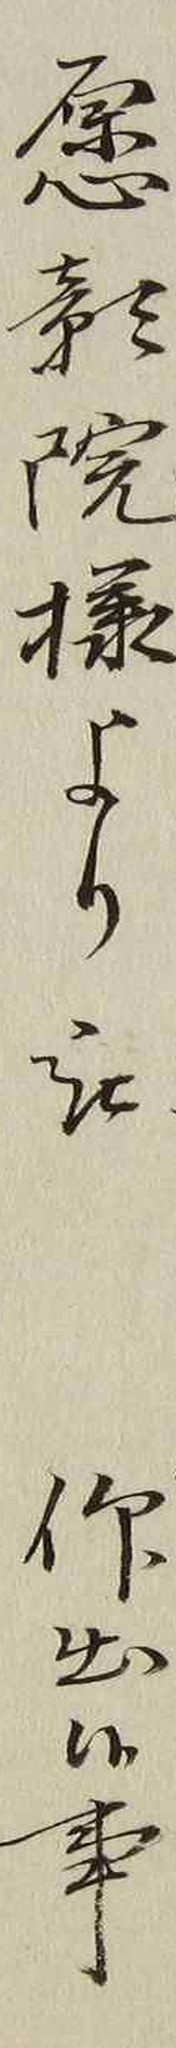愿彰院様より被仰出候事
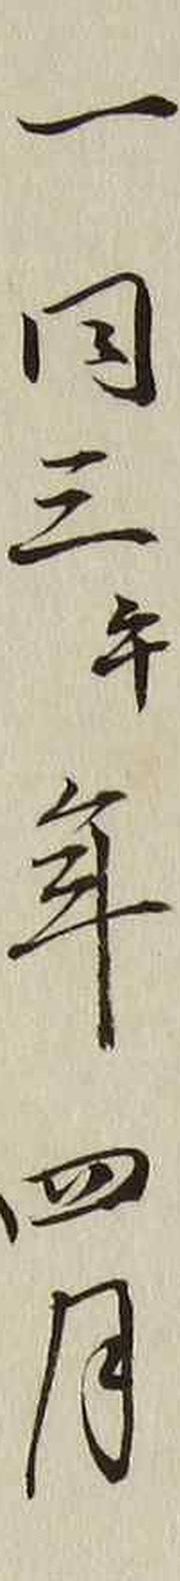一同三午年四月
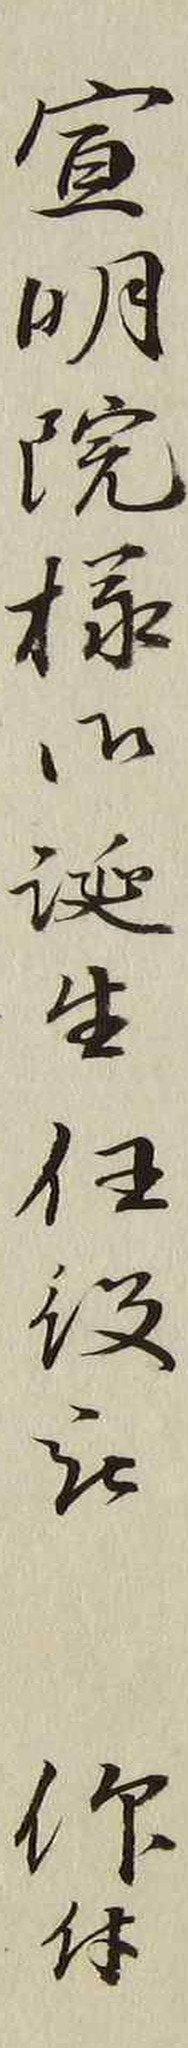宣明院様御誕生任役被仰付
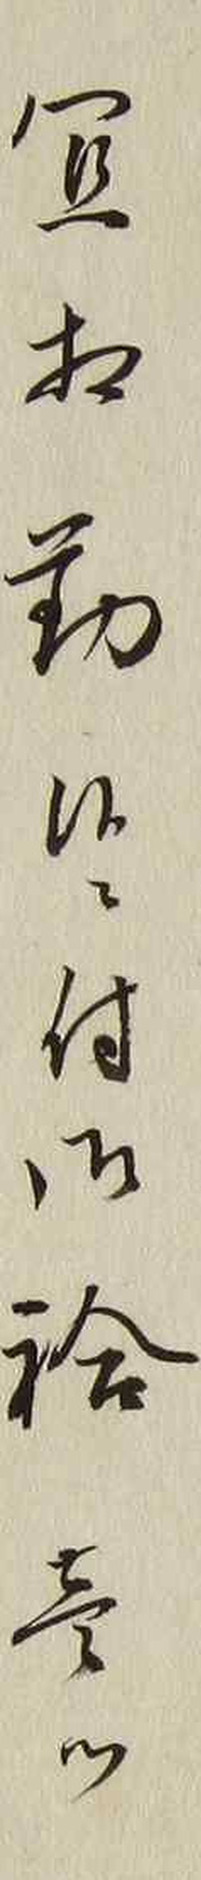宜相勤め候ニ付御袷壱ツ
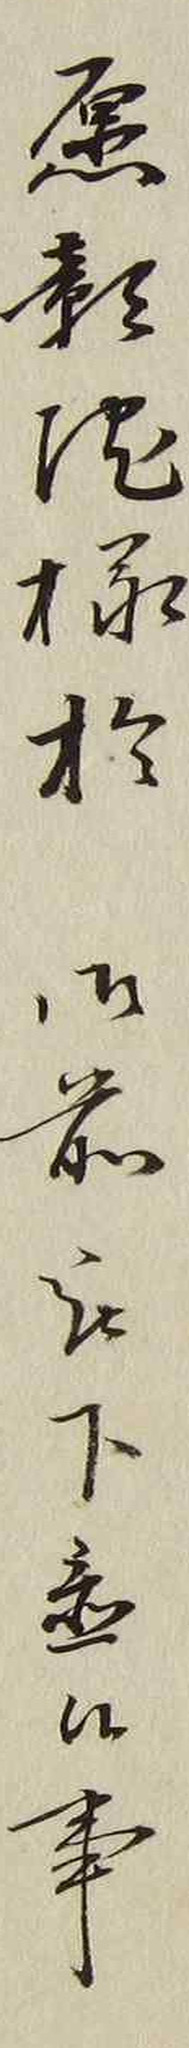愿彰院様於御前被下置候事
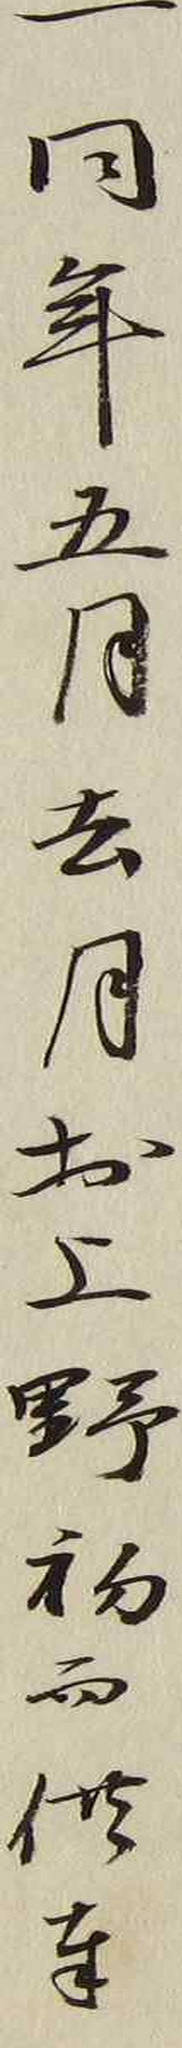一同年五月去月於上野初而供奉
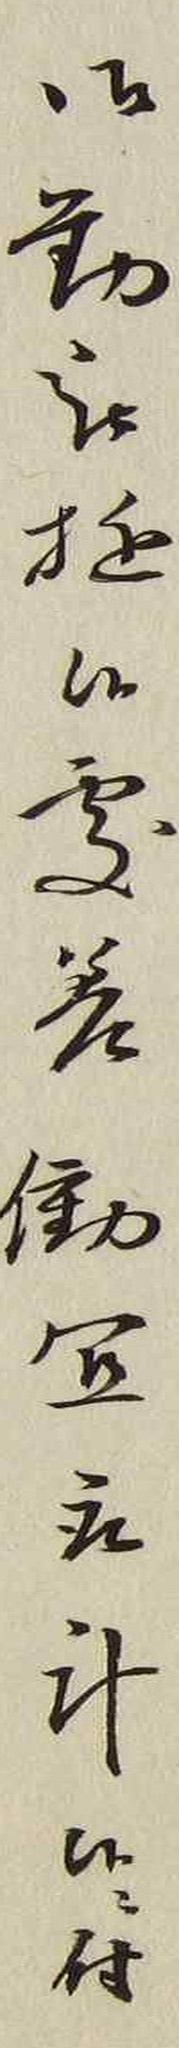御勤被遊候処差働宜取計候ニ付

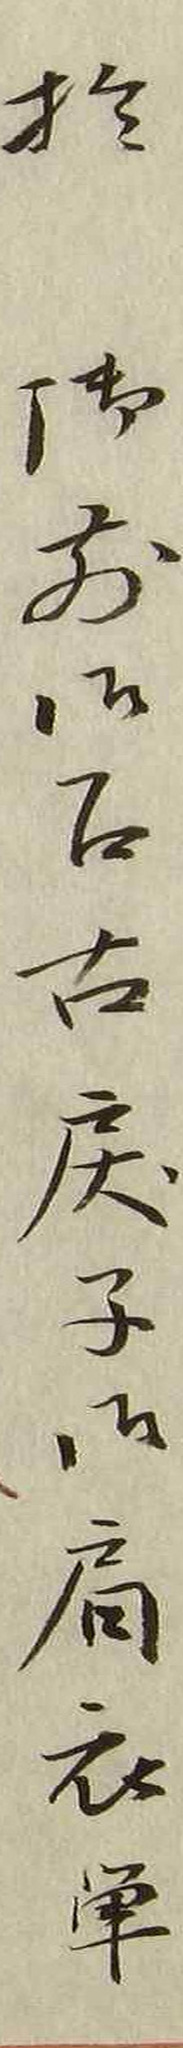於御前ニ御召古戻子御肩衣単
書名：諸士系譜　巻之19　い之部19
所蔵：会津若松市立会津図書館
